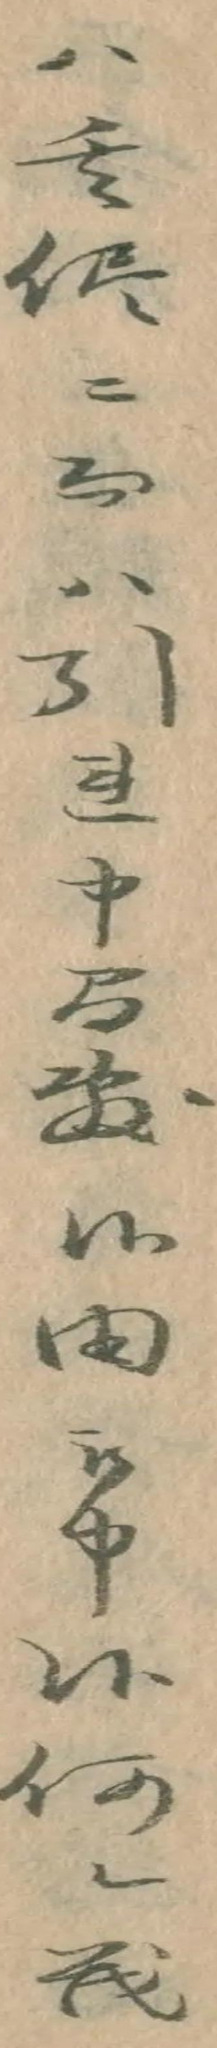は其侭に而は引連申間敷候由被申候何れ茂

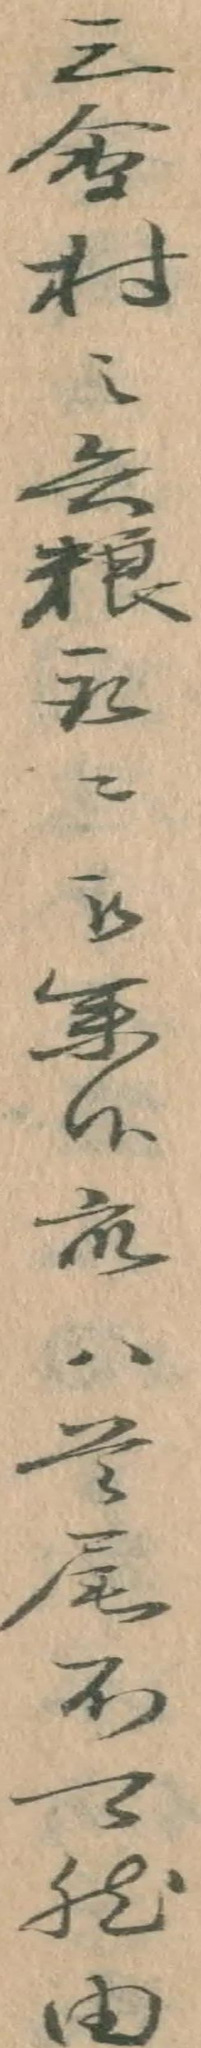三会村之兵粮取に被参候衆は首尾不可然由
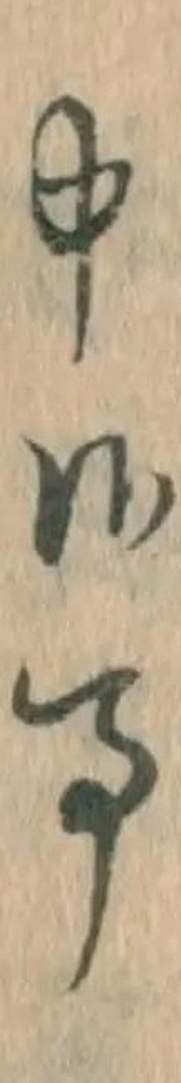申候事
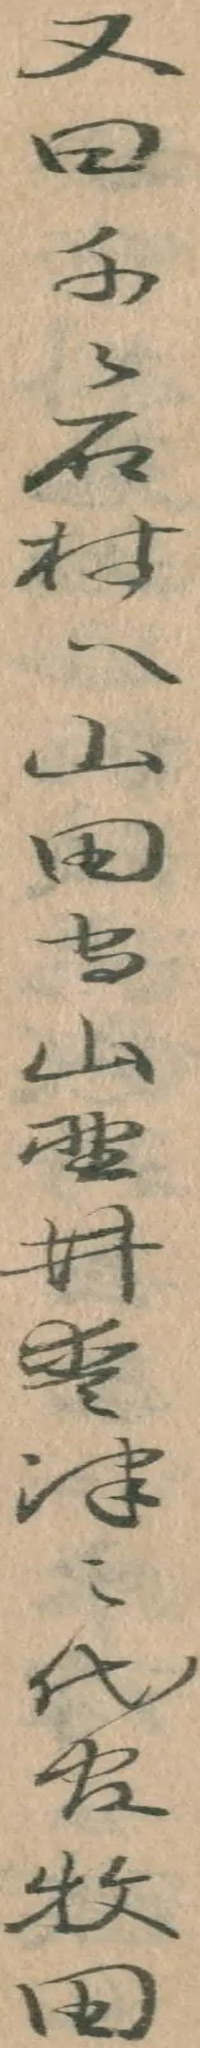又曰千之石村へ山田守山野井愛津之代官牧田
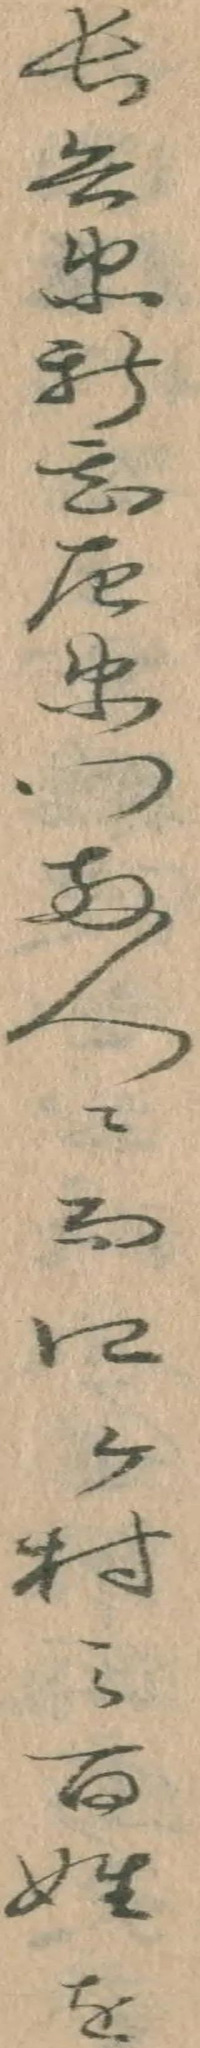長兵衛新甚左衛門両人に而四け村之百姓を
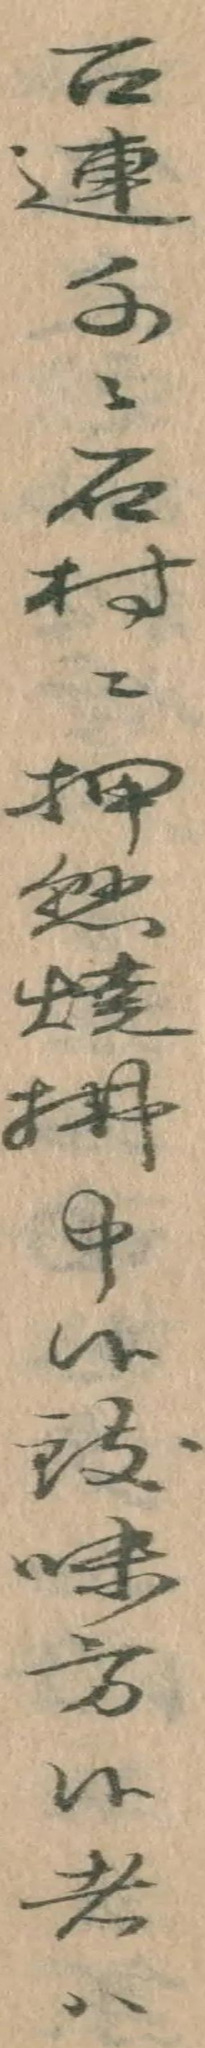召連千々石村に押懸焼払申候致味方候者は
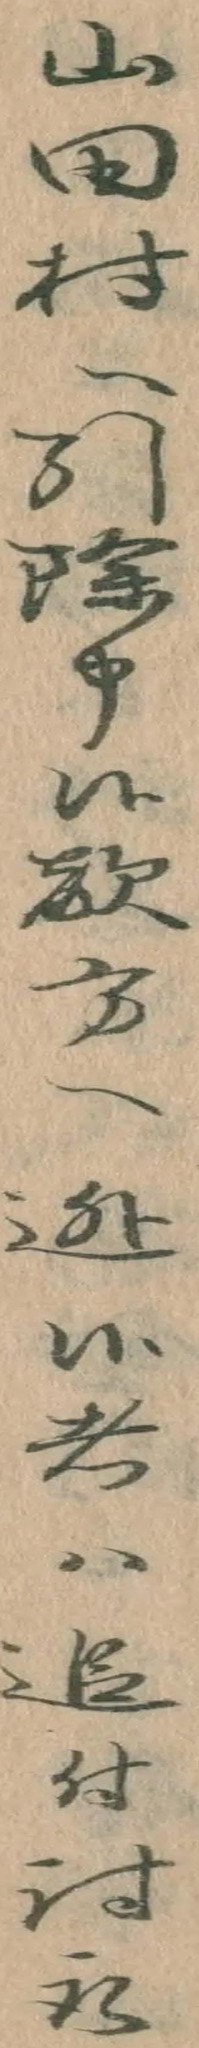山田村へ引除申候敵方へ逃候者は追付討取
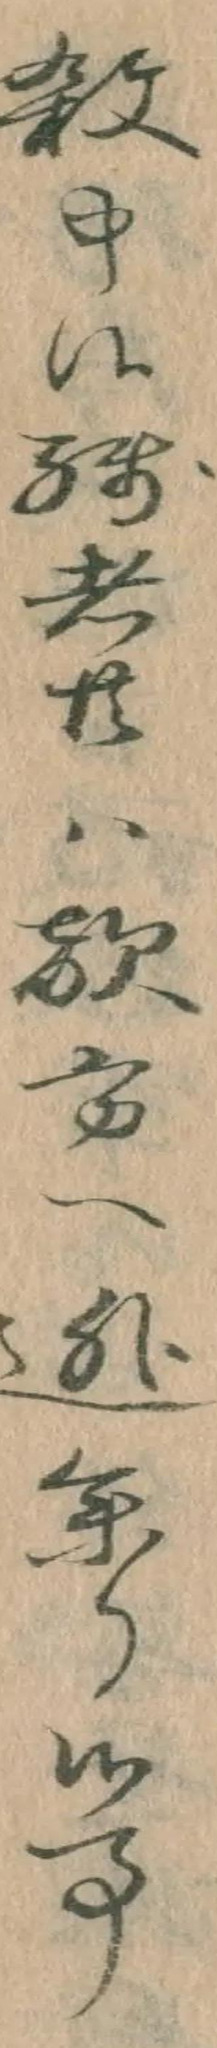殺申候残者共は敵方へ逃参り候事
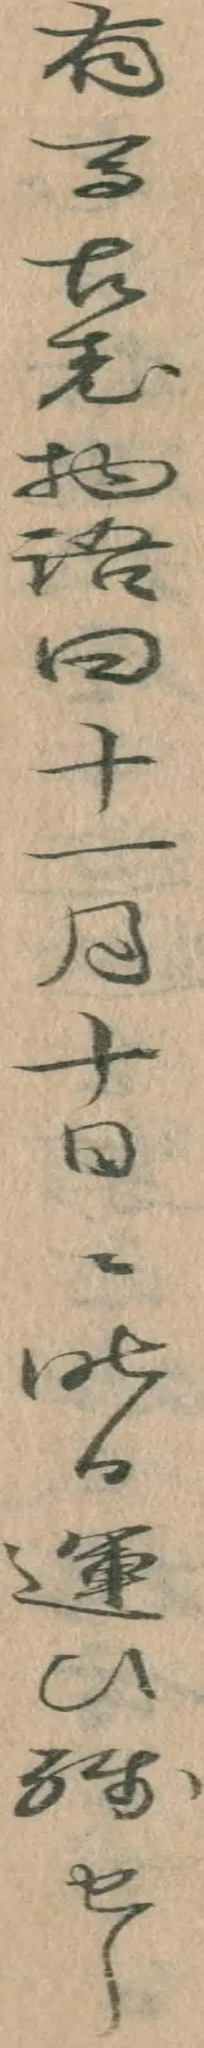有馬古老物語曰十一月十日に昨日運ひ残せし
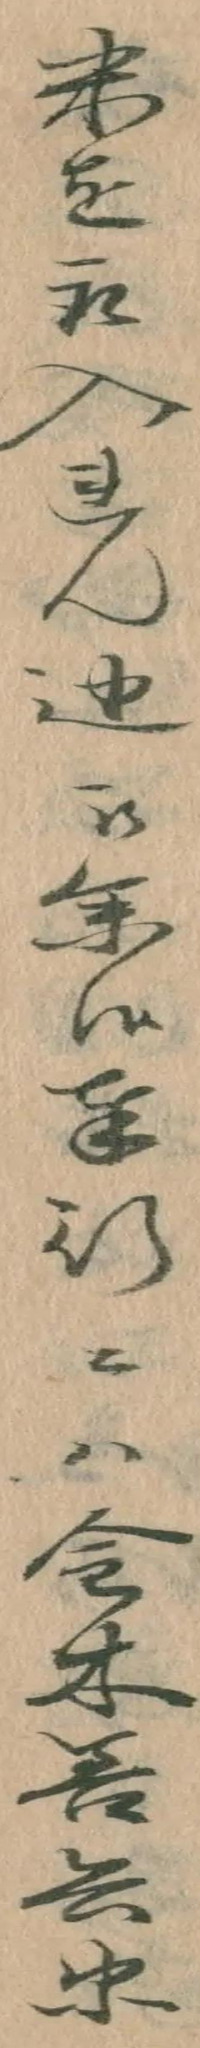米を取入連ん迚被参候奉行には金木善兵衛
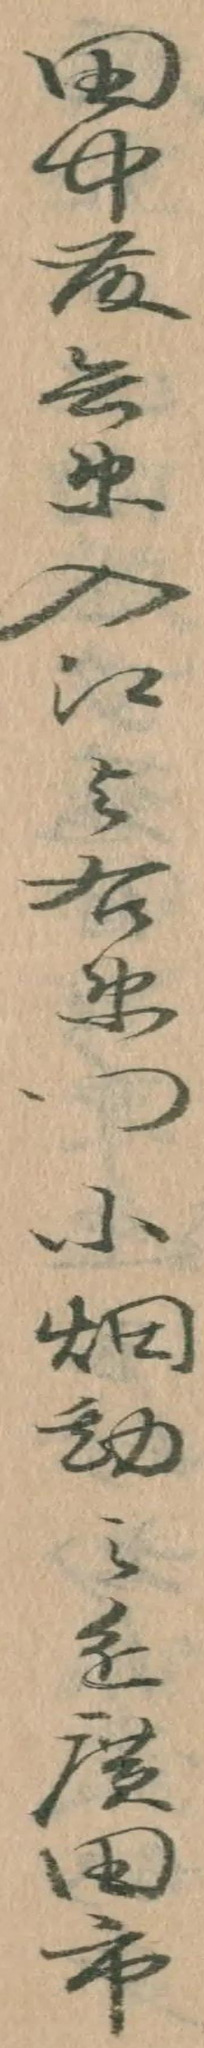田中藤兵衛入江与右衛門小畑勘之進廣田市
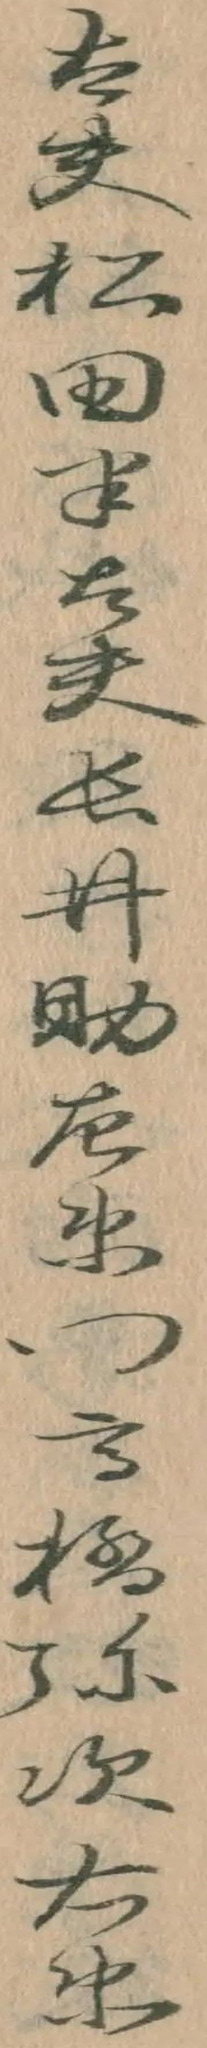太夫松田半太夫長井助左衛門高橋弥次右衛
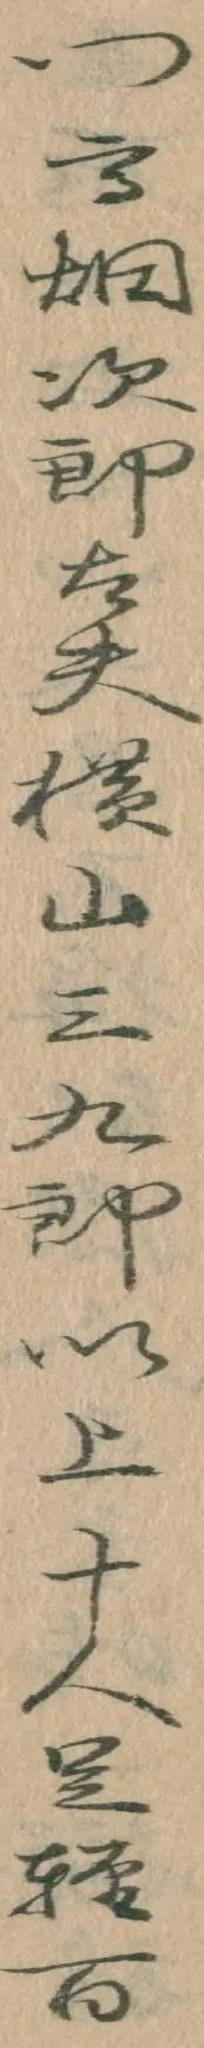門高畑次郎太夫横山三九郎以上十人足軽百
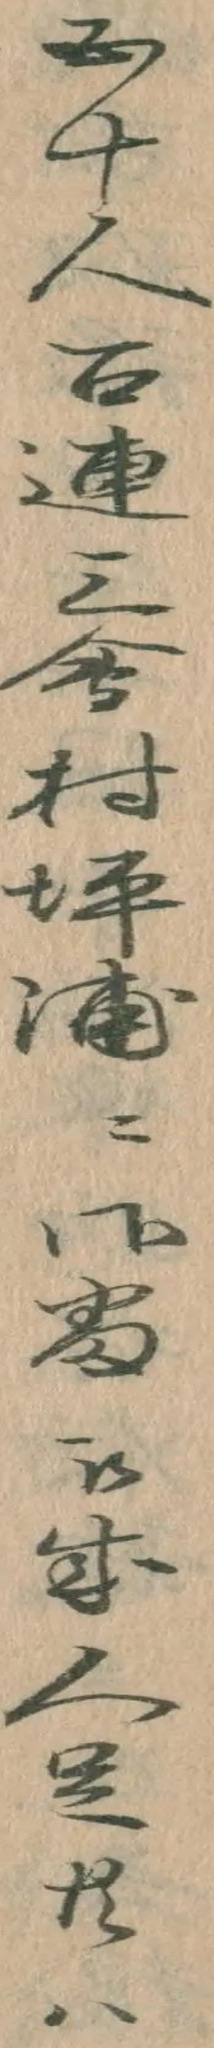五十人召連三会村坪浦に御番被成人足共は
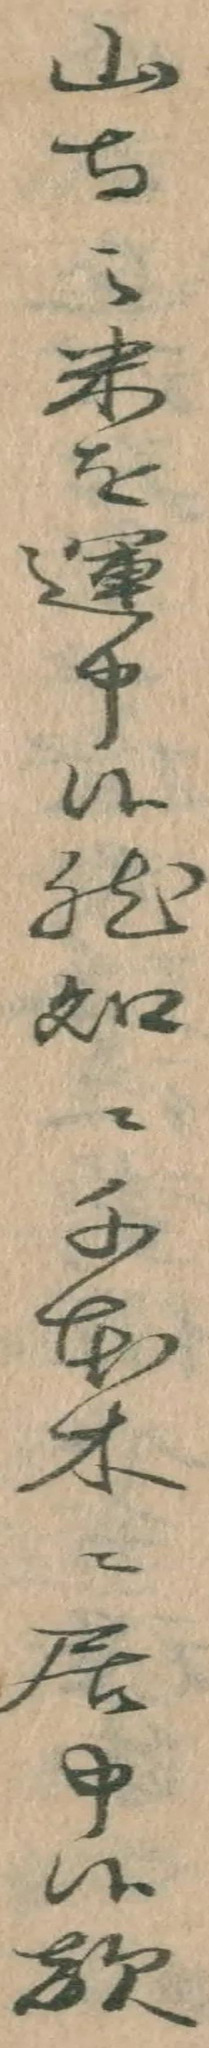山寺之米を運申候然処に千本木に居申候敵
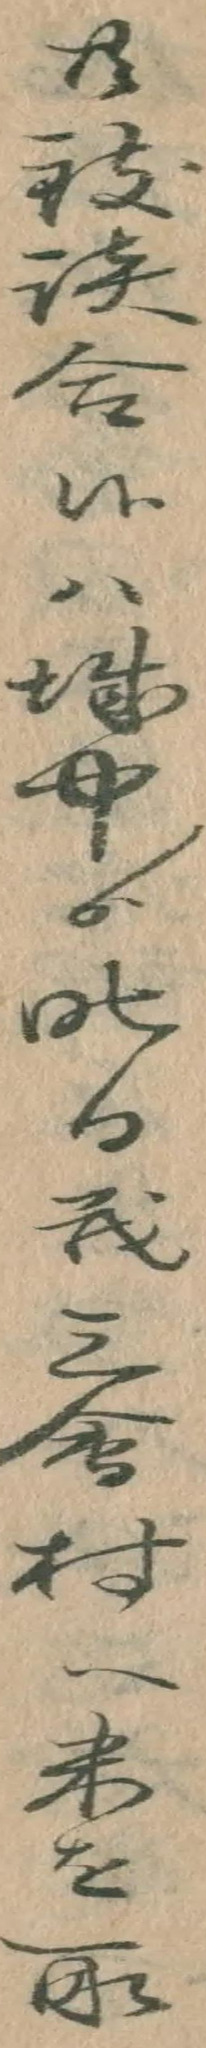共致談合候は城中ゟ昨日茂三会村へ米を取
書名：切支丹御退治記 49巻. [2]
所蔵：国立国会図書館 National Diet Library, JAPAN
